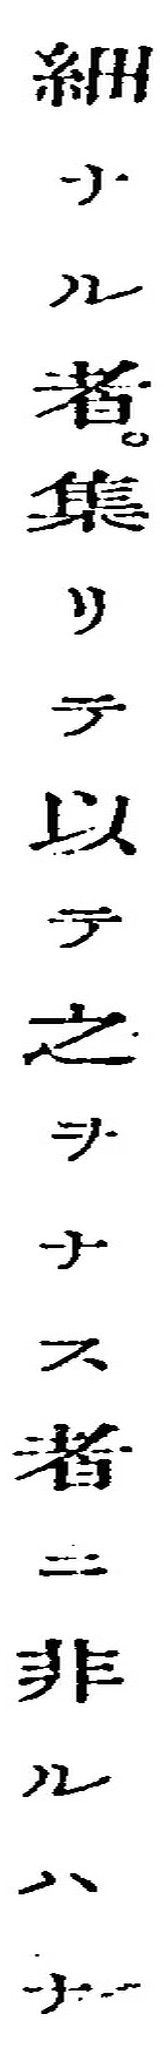細なる者。集りて以て之をなす者に非るはな
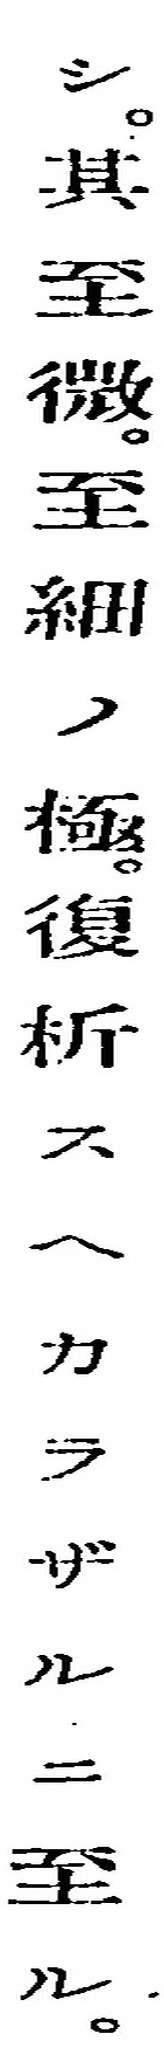し。其至微。至細の極。復析すへからざるに至る。
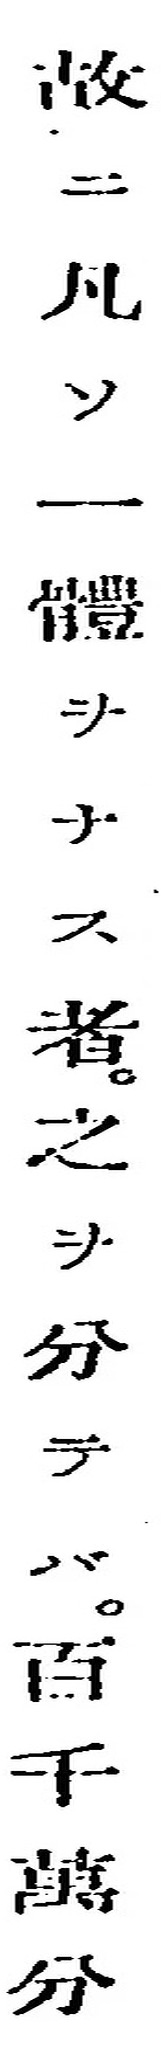故に凡そ一體をなす者。之を分てば。百千萬分
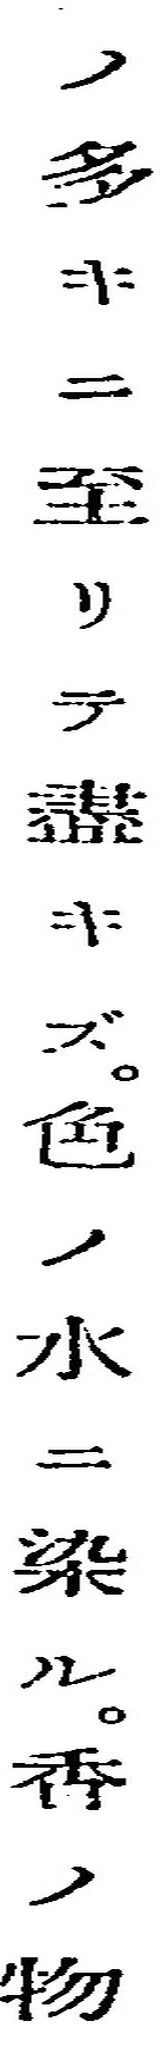の多きに至りて盡きず。色の水に染る。香の物
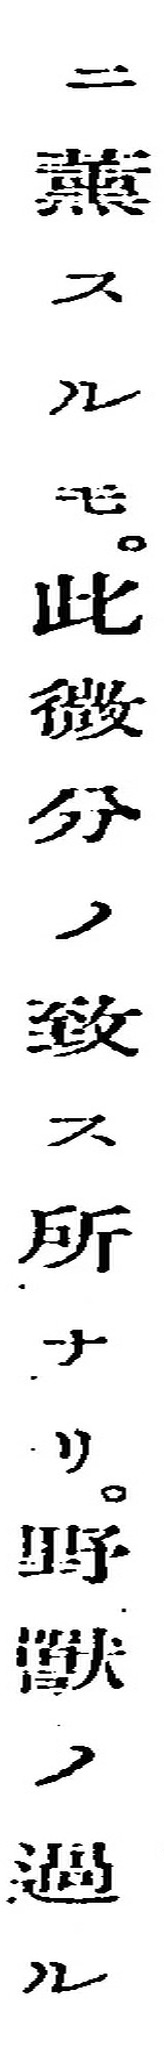に薫するも。此微分の致す所なり。獣の過る
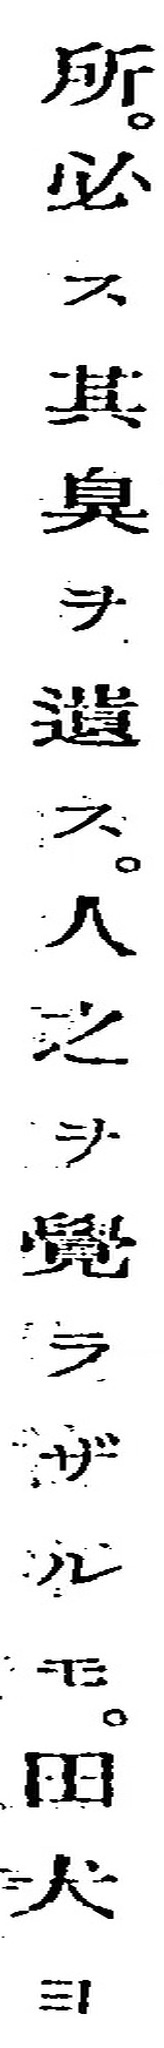所。必す其臭を遺す。人之を覚らざるも。田犬よ
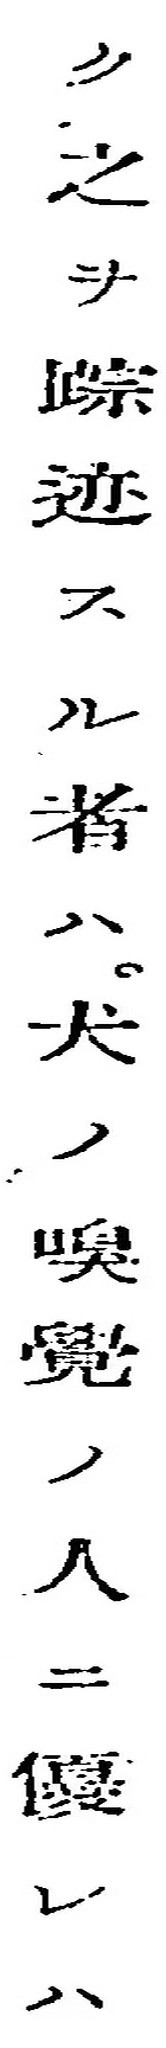く之を踪迹する者は。犬の嗅覚の人に優れは
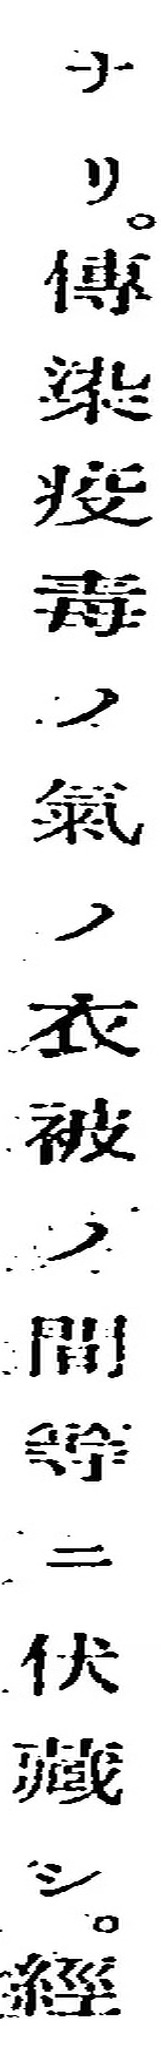なり。伝染疫毒の気の衣被の間等に伏蔵し。經

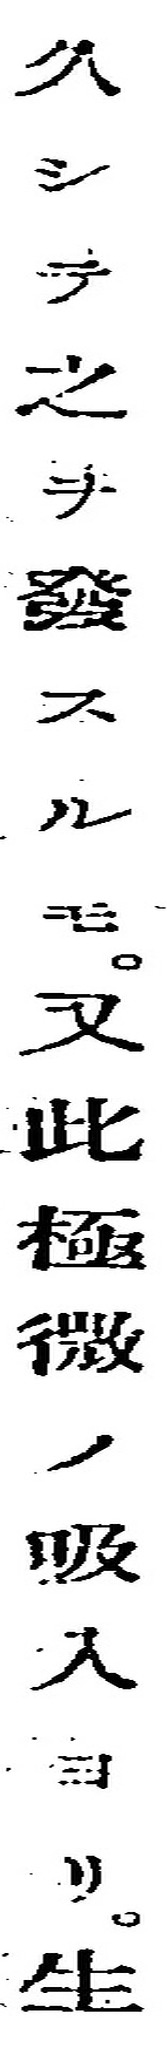久して之を發するも。又此極微に吸入より。生
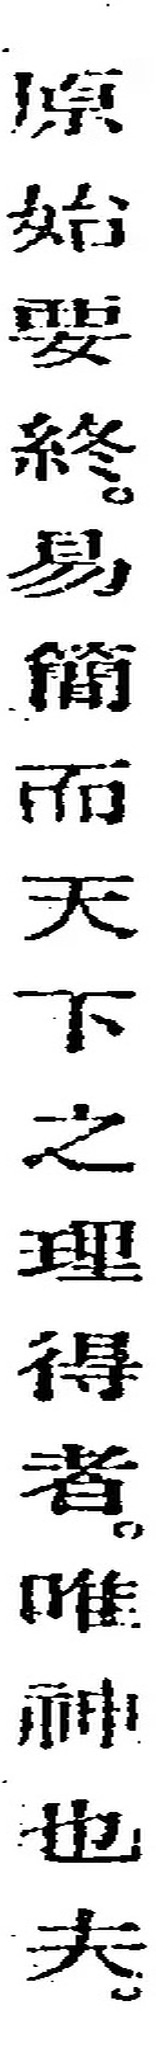原始要終。易簡而天下之理解得者。唯神也夫。
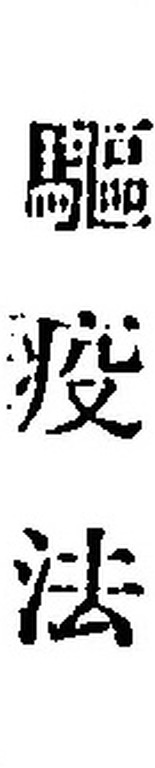驅疫法
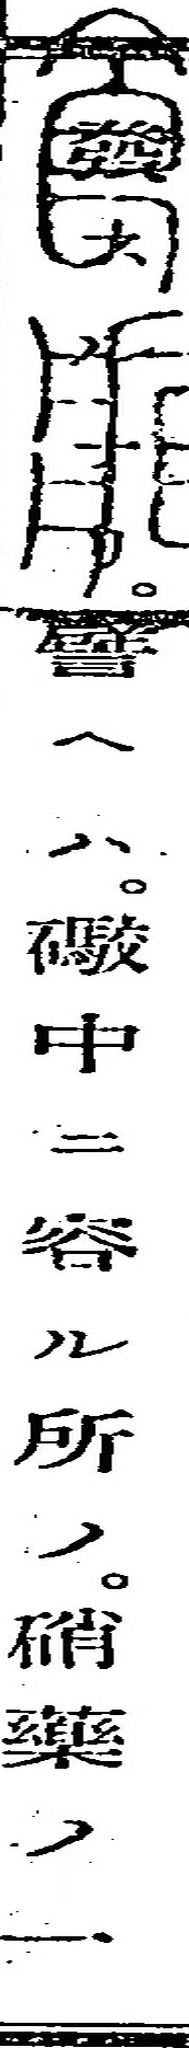發するなり。譬へは。砲中に容る所の。硝薬の一
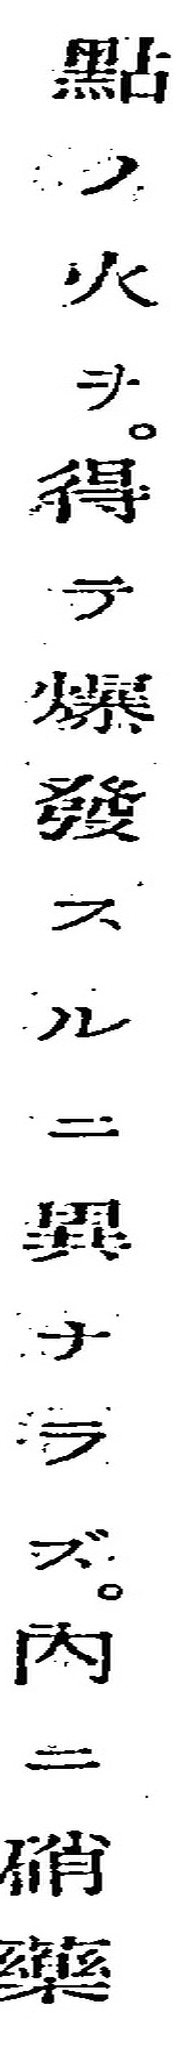点の火を。得て爆発するに異ならず。内に硝薬
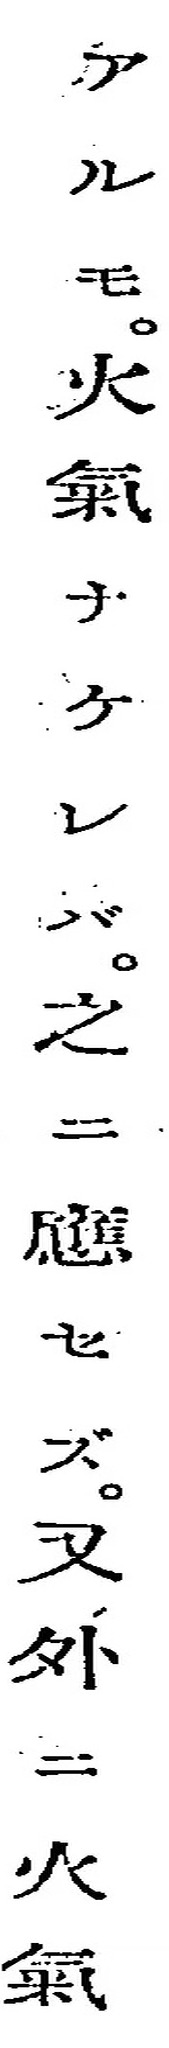あるも。火気なければ。之に応せず。又外に火気
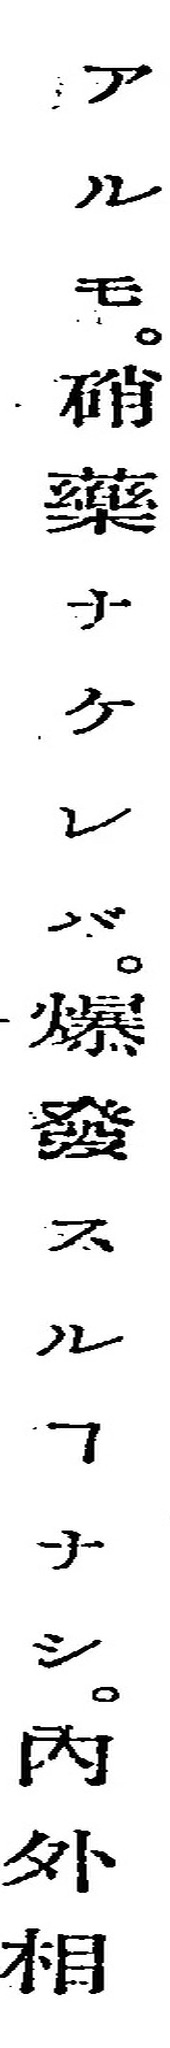あるも。硝薬なければ。爆発することなし。内外相

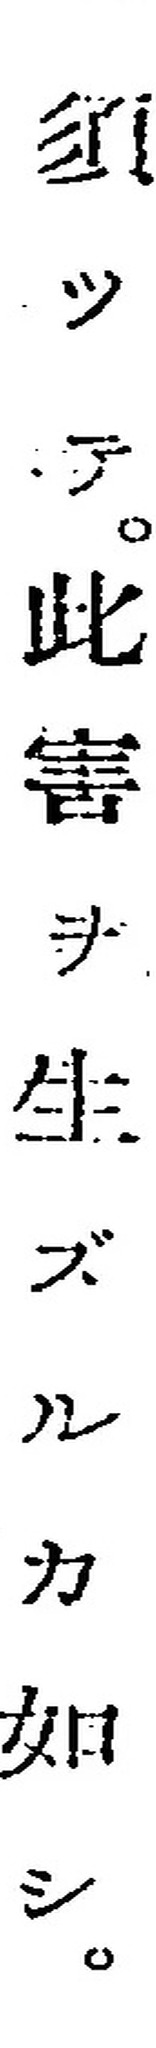須つて。此害を生ずるか如し。
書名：駆疫法 : コレラヲヨケ並ニナホスシカタ
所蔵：国立国会図書館 National Diet Library, JAPAN
